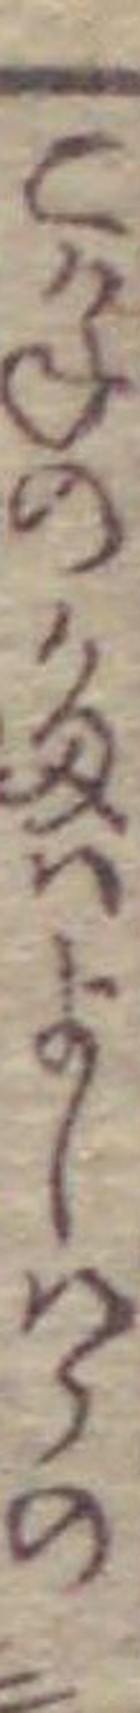こかねのかまはよしはらの
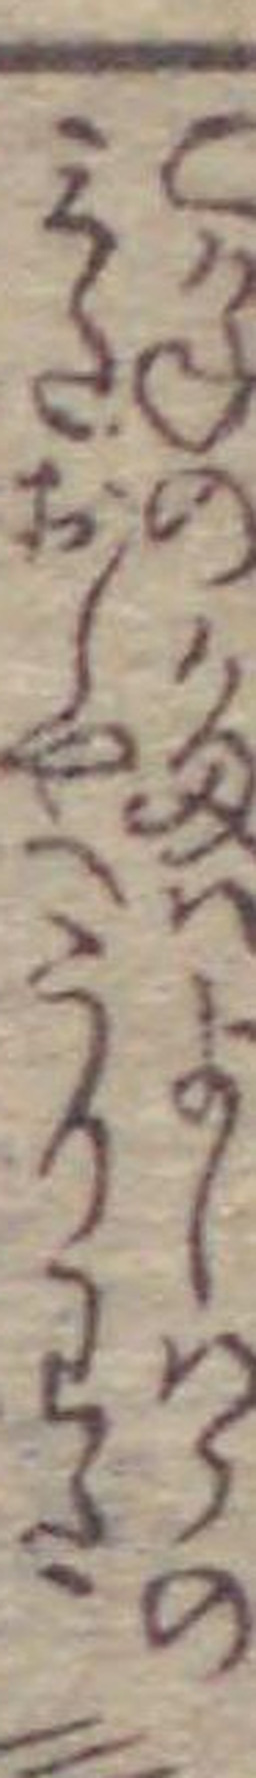みたおしやへうりわた
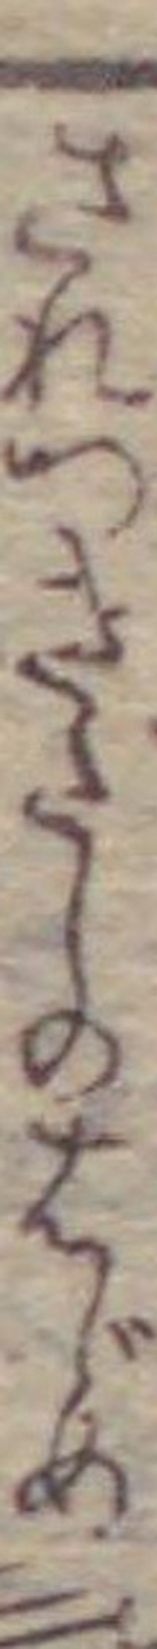されつきたしのはじめ
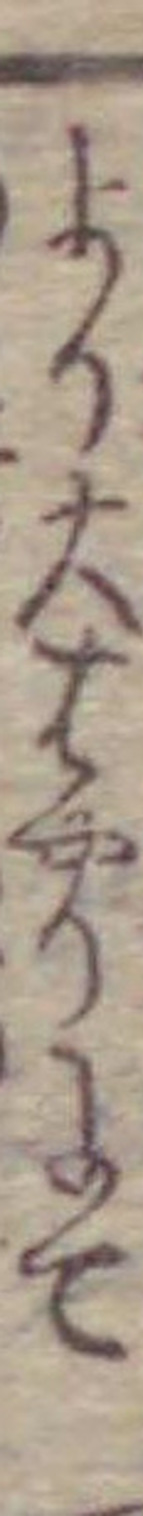より大はやりにて
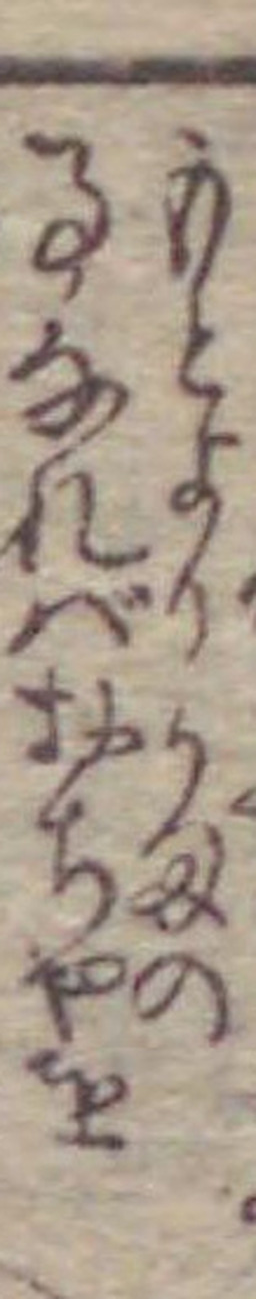事なればおちやを
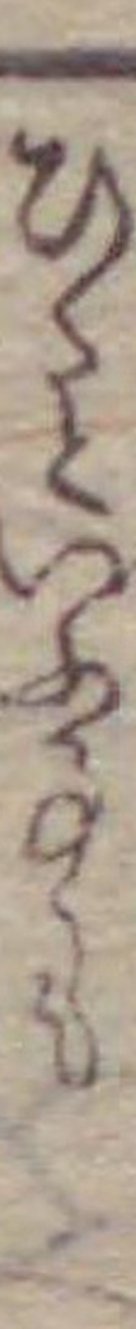ひくといふ事も
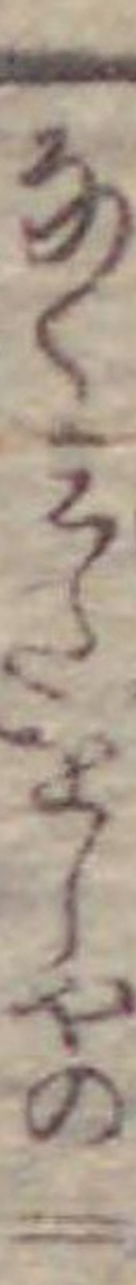なくみたをしやの
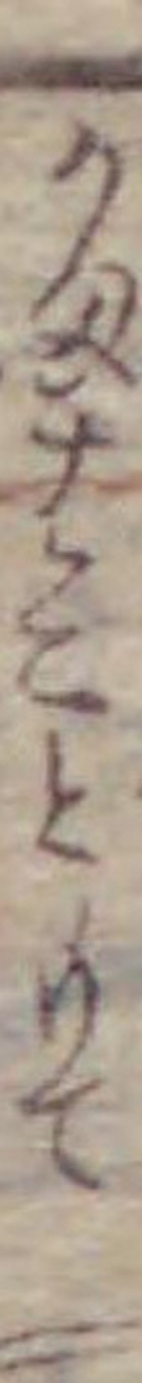かまはこともて
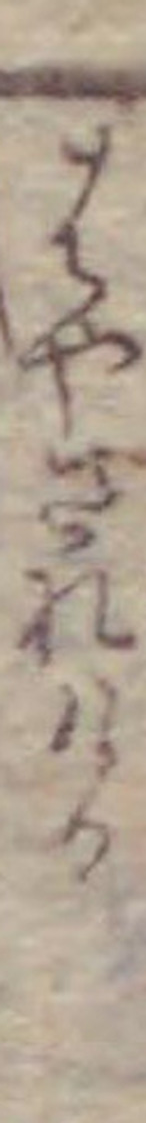はやされける
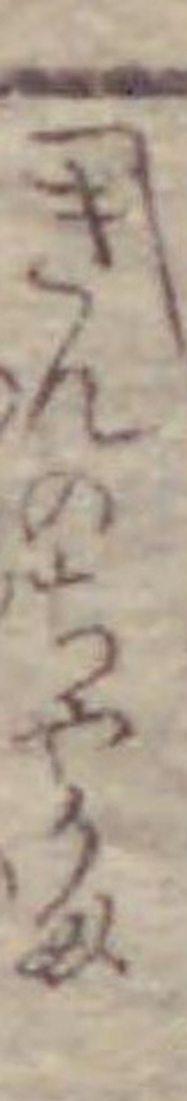〽きんのちやかま
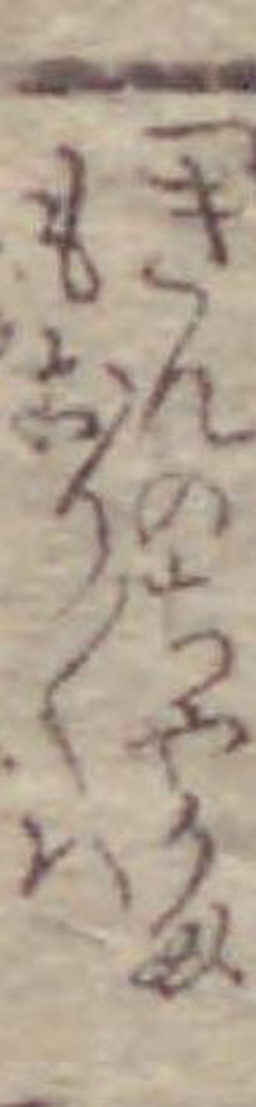もおり〳〵は
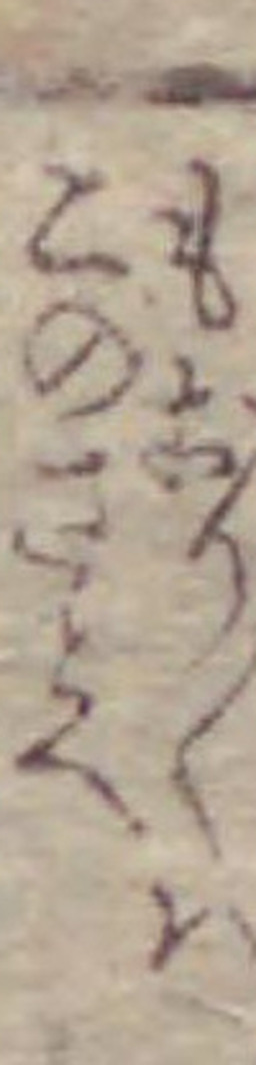このさとへ
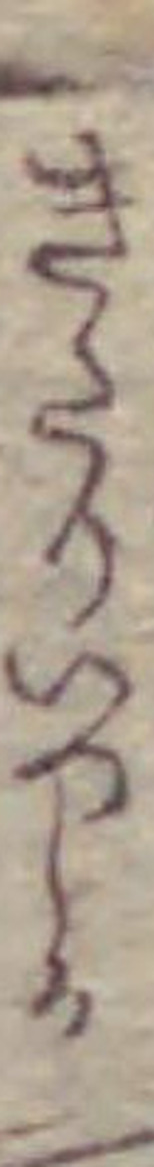きたりいつしか
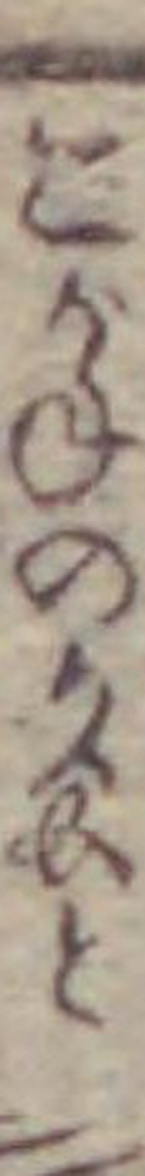こかねのかまと
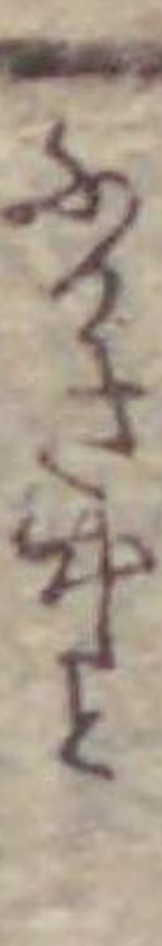ふかき中と
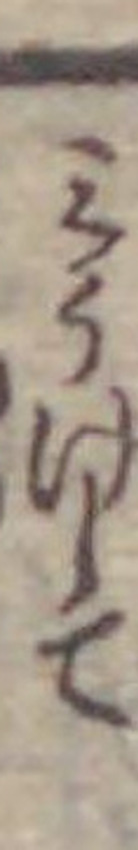みうけして
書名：万物小遣帳 : 2巻
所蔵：国立国会図書館 National Diet Library, JAPAN
